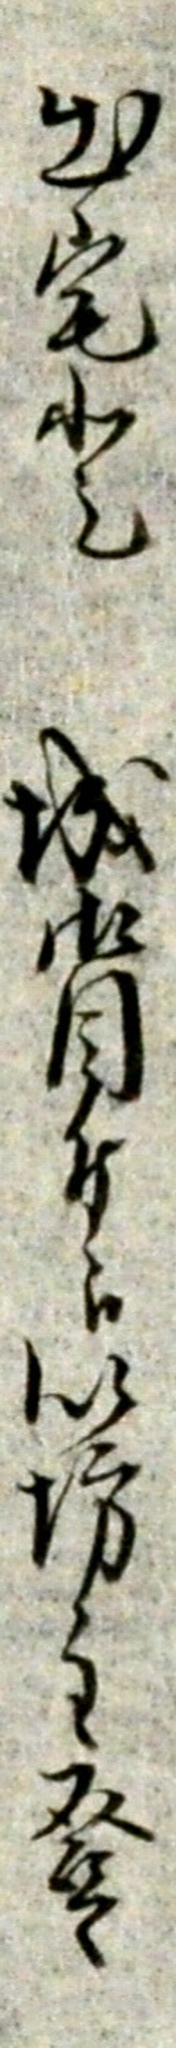出宅登城御目付江以坊主登
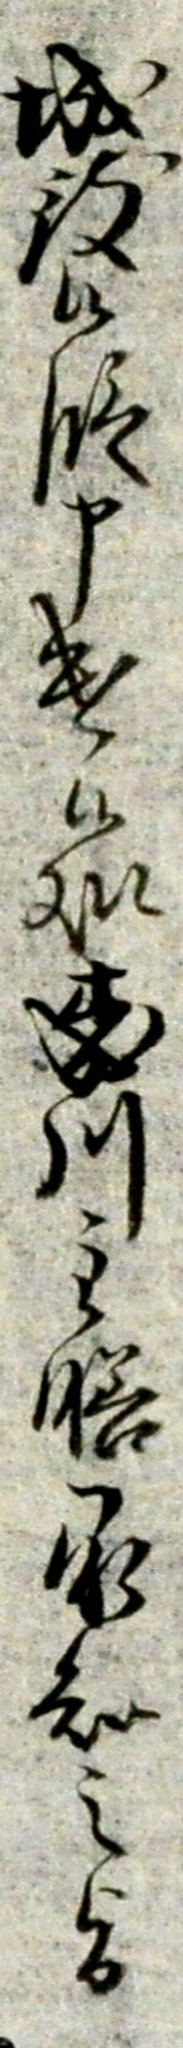城致候段申遣候処森川主膳承知之旨
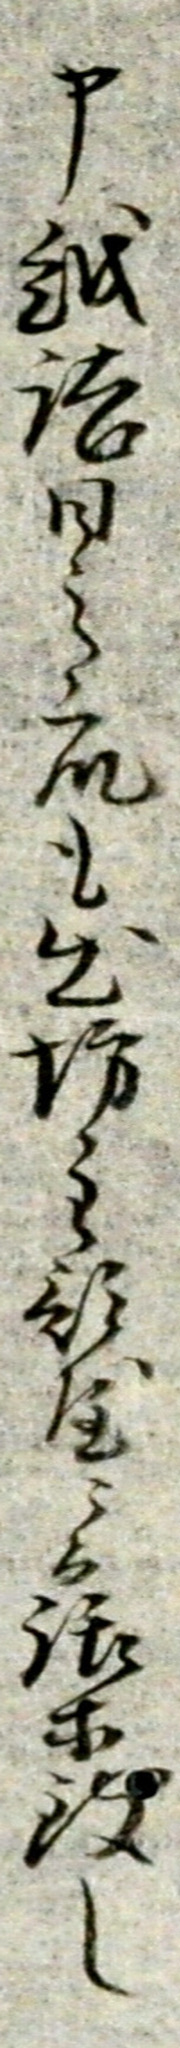申越詰日之衆も出坊主部屋ニ而話等致し
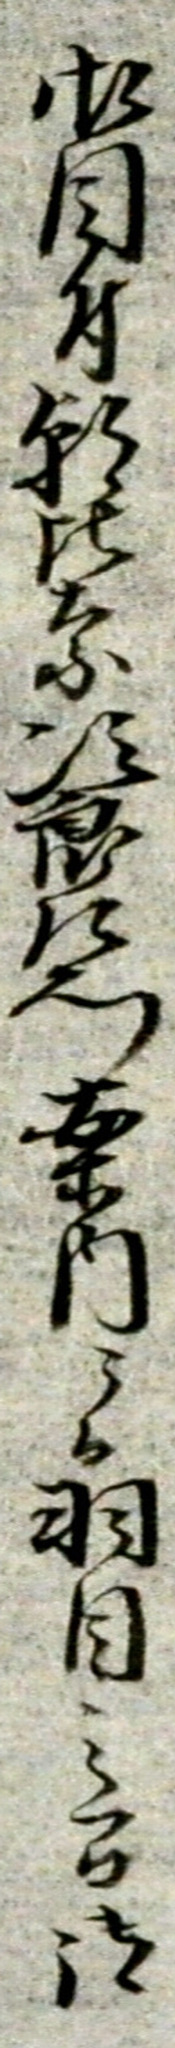御目付朝比奈次郎左衛門案内ニ而羽目之間御
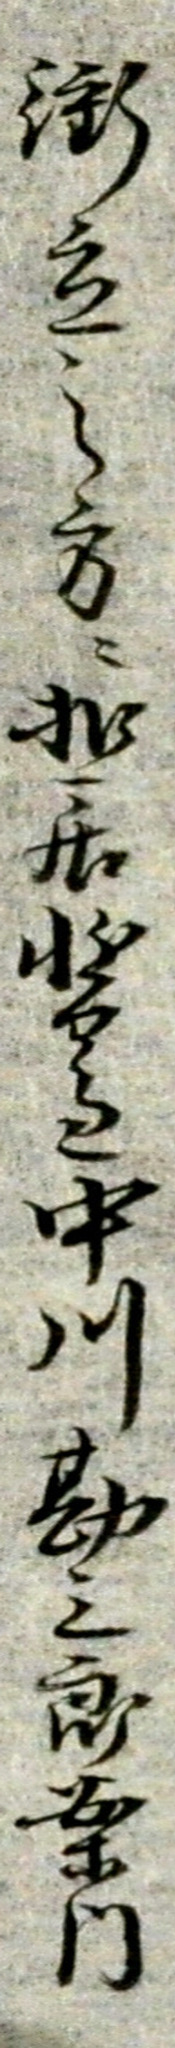衝立之方ニ扣居暫過中川勘三郎案内
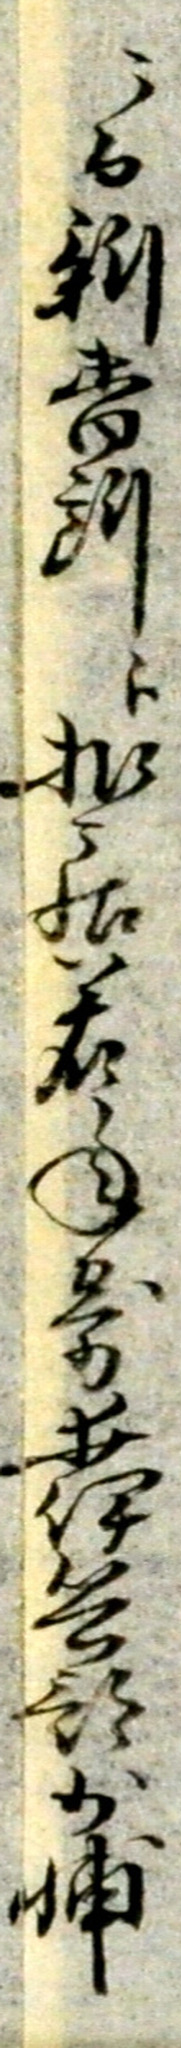ニ而新番所江扣居若年寄井伊兵部少輔
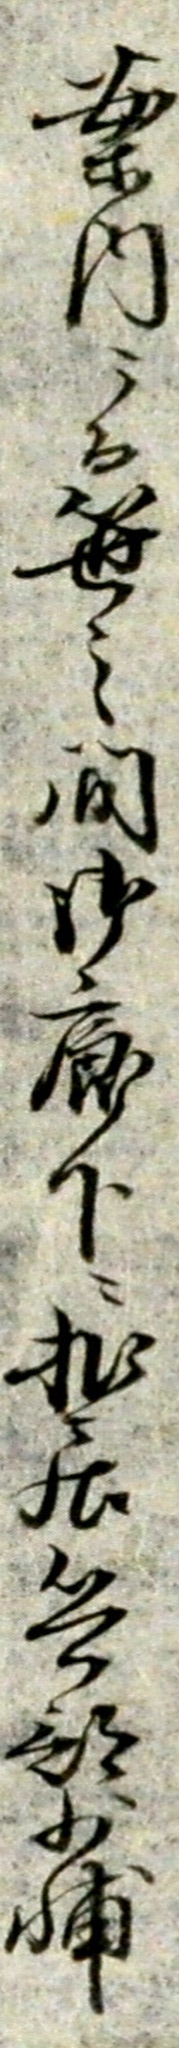案内ニ而笹之間御廊下ニ扣居兵部少輔
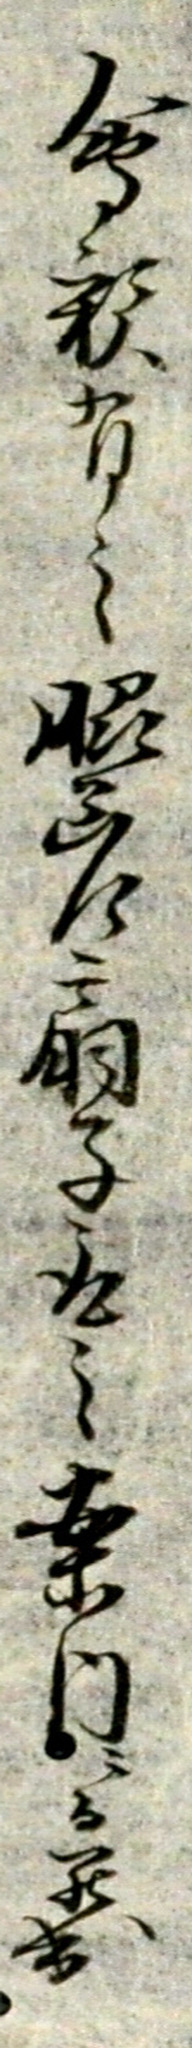会釈有之脇差扇子取之案内ニ而罷出候
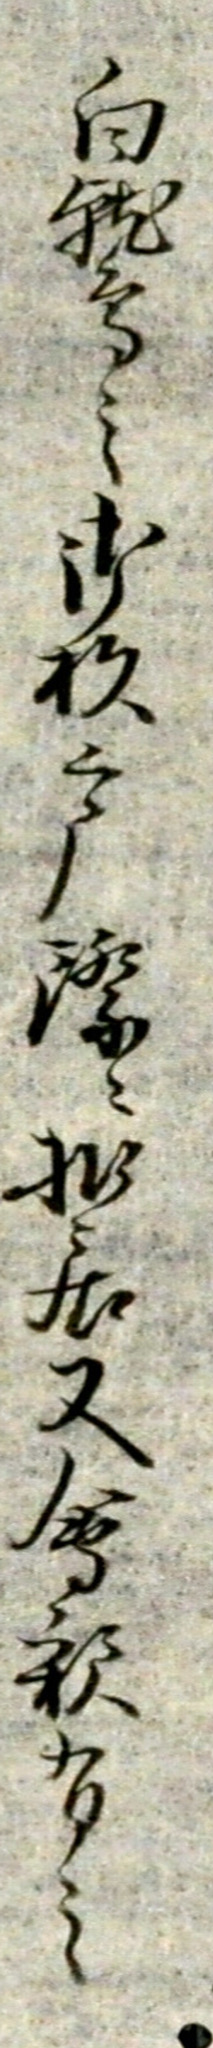白鷲之御杉戸際ニ扣居又会釈有之
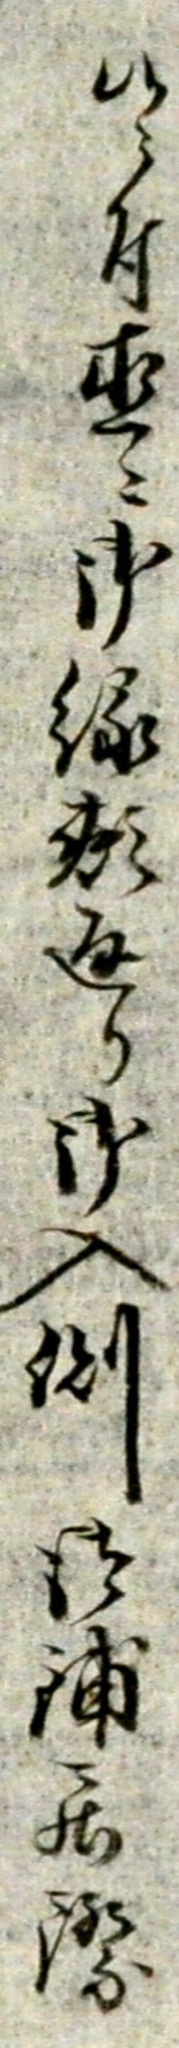候ニ付直ニ御縁頬通り御入側御鋪居際
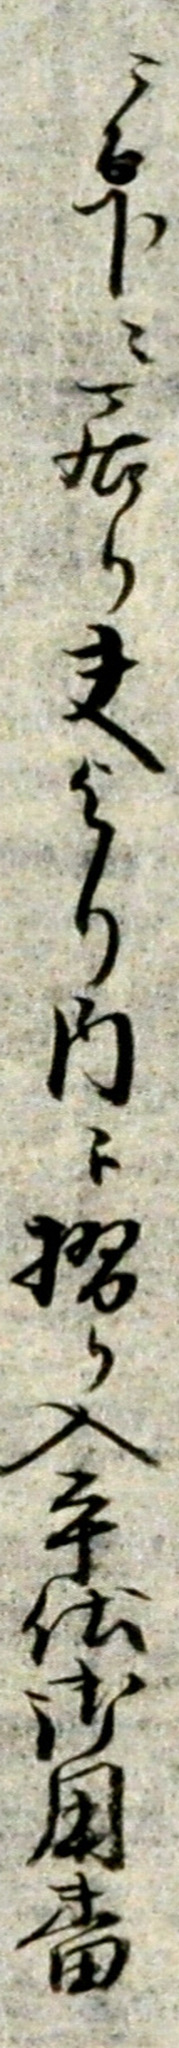ニ被下ニ居り夫より内江摺り入平伏御用番
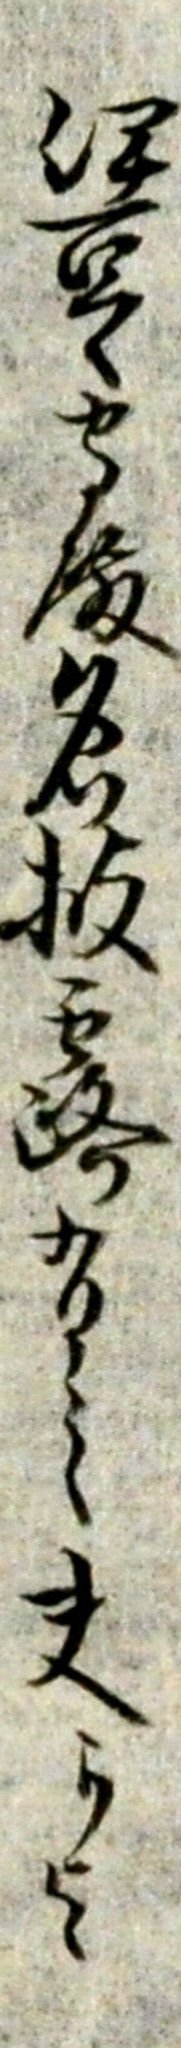伊豆守殿名披露有之夫江と
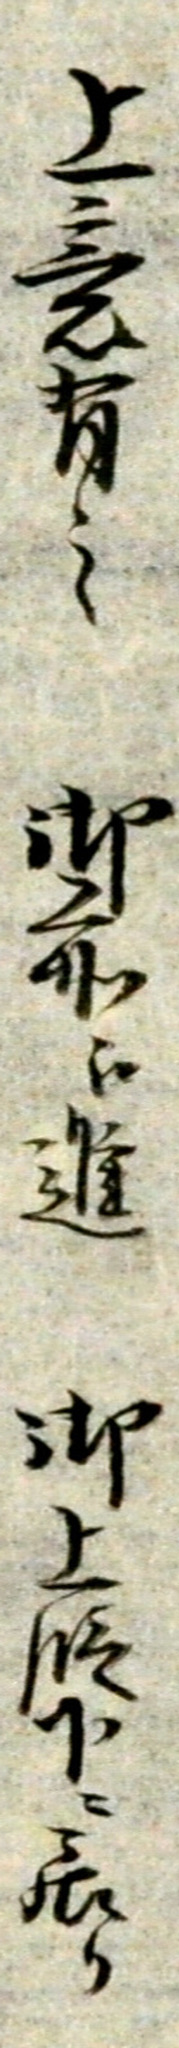上意有之御前江進御上段下ニ居り
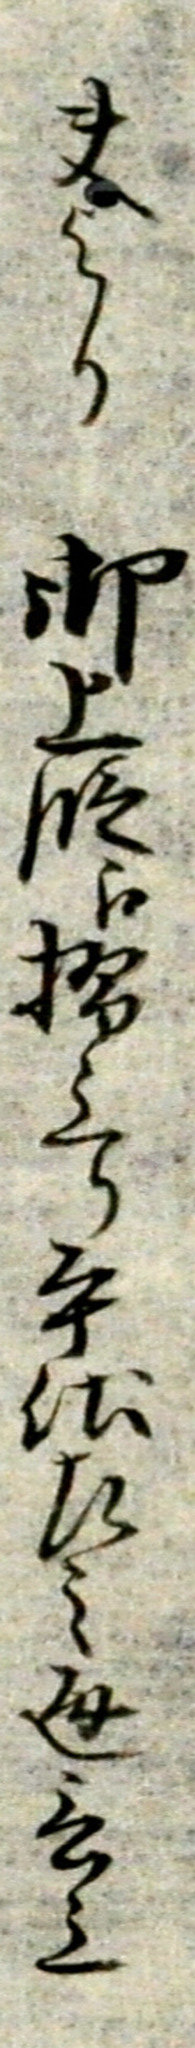夫より御上段江摺上り平伏左之通言上
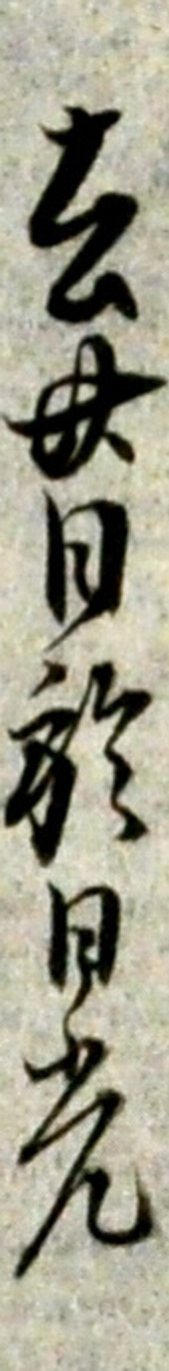去廿日於日光
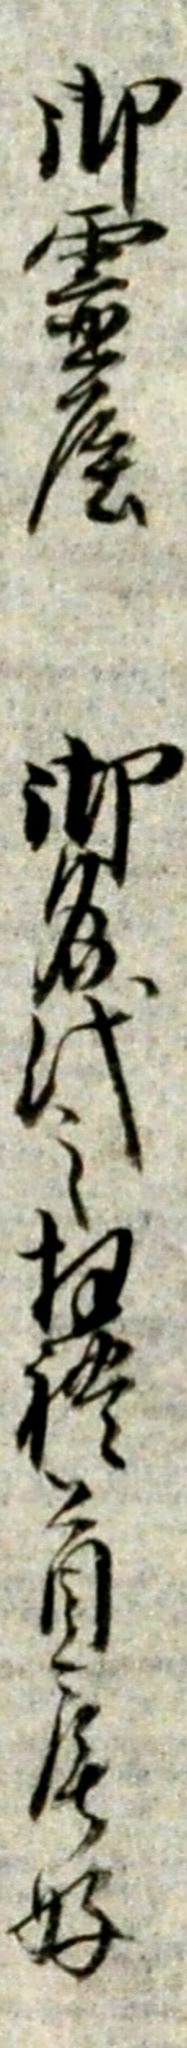御霊屋御名代之拝礼首尾張好
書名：日光御名代相勤候節ノ留
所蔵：伊那市立高遠町図書館・合同会社AMANE
